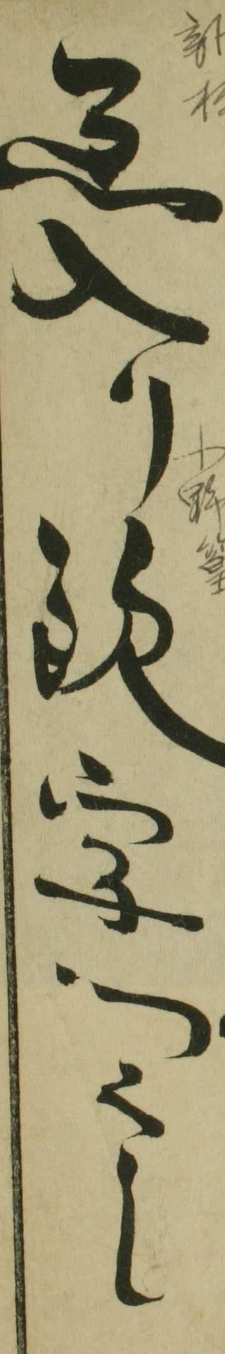ゑ入歌字つくし

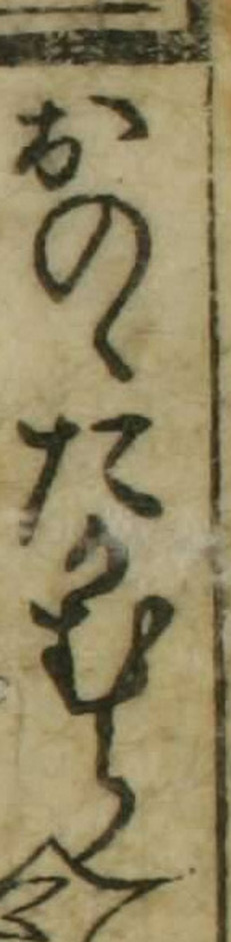おのゝたかむら
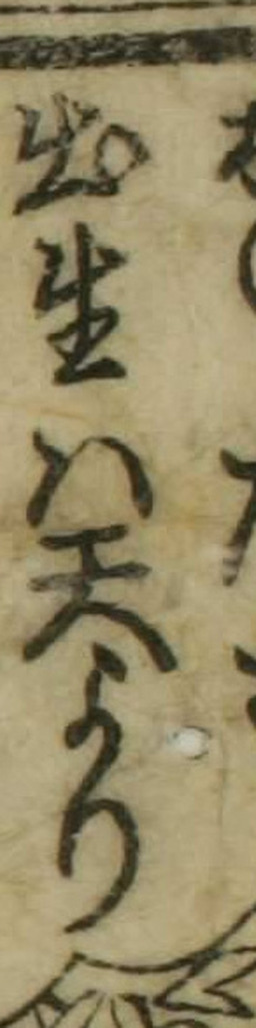出生は天より
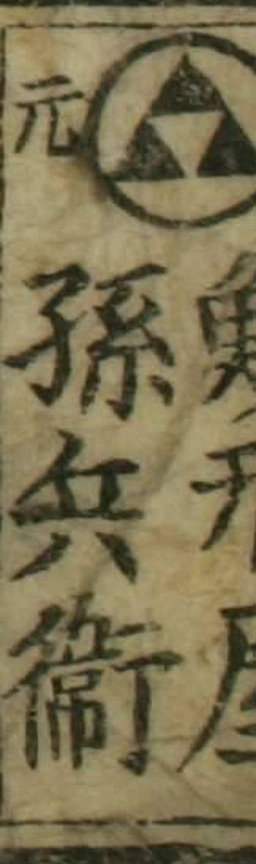孫兵衛
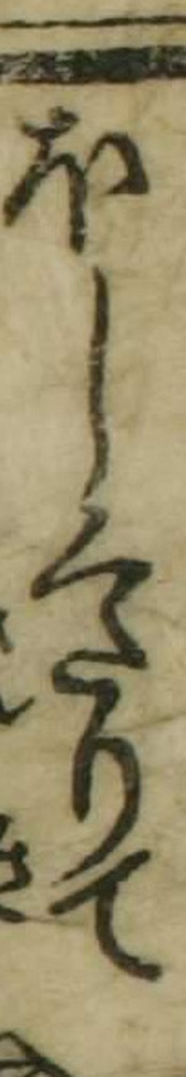ほしくたりて
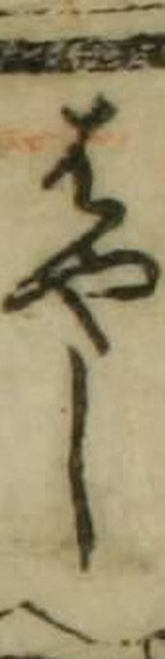はやし
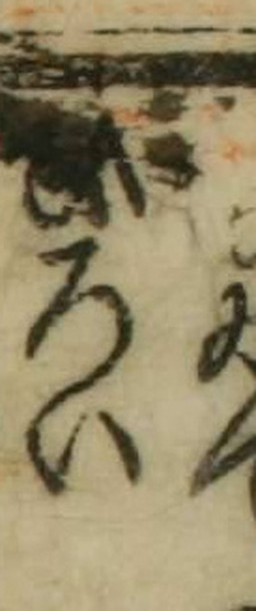ひろい
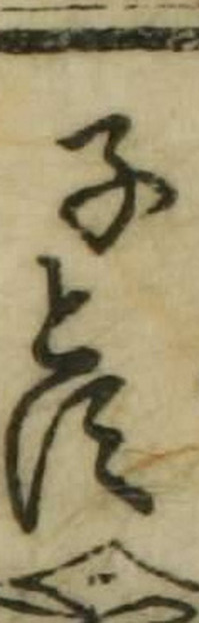子とす
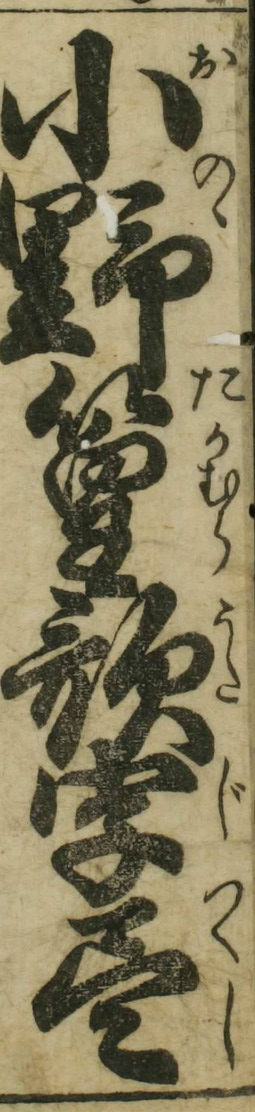小野篁歌字尽
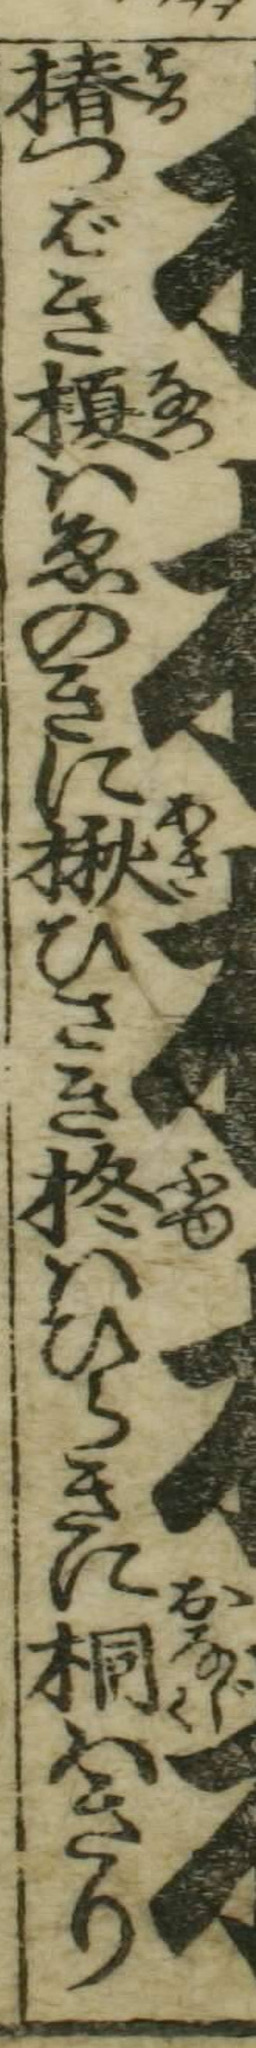椿つばき榎はゑのきに楸ひさき冬はひらきに桐はきり
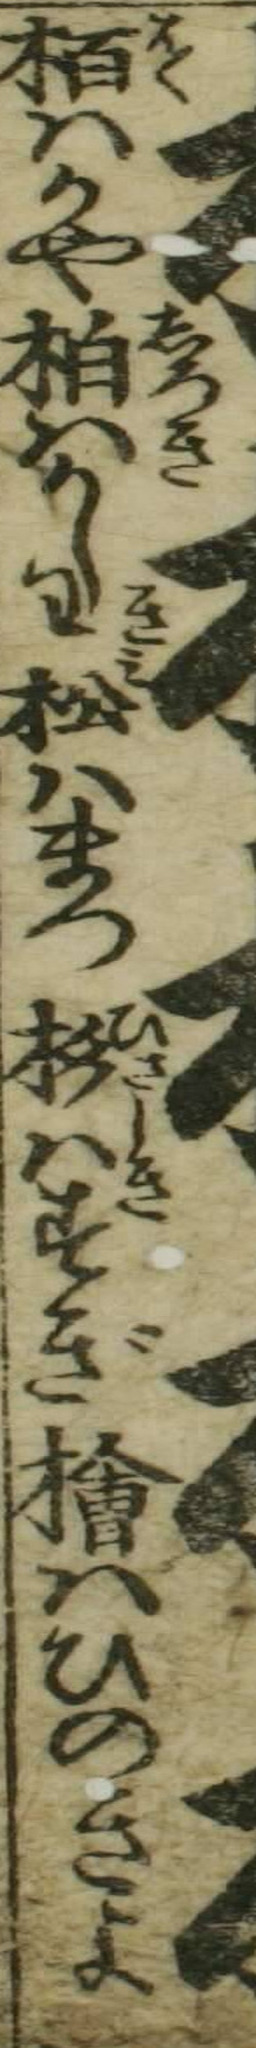栢はかや柏はかしわ松はまつ杉はすぎ檜はひのきよ
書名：小野篁歌字尽
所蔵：東京学芸大学附属図書館 国文学研究資料館
